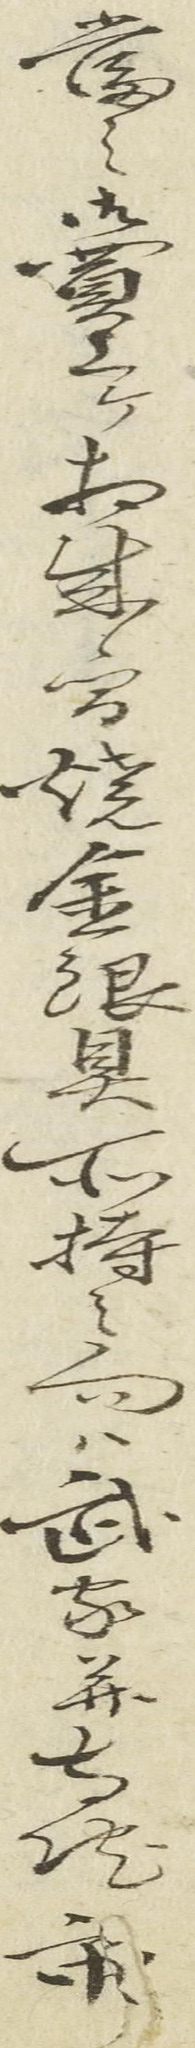当之御買上ケ相成候間焼金銀具所持之向ハ武家幷寺院市
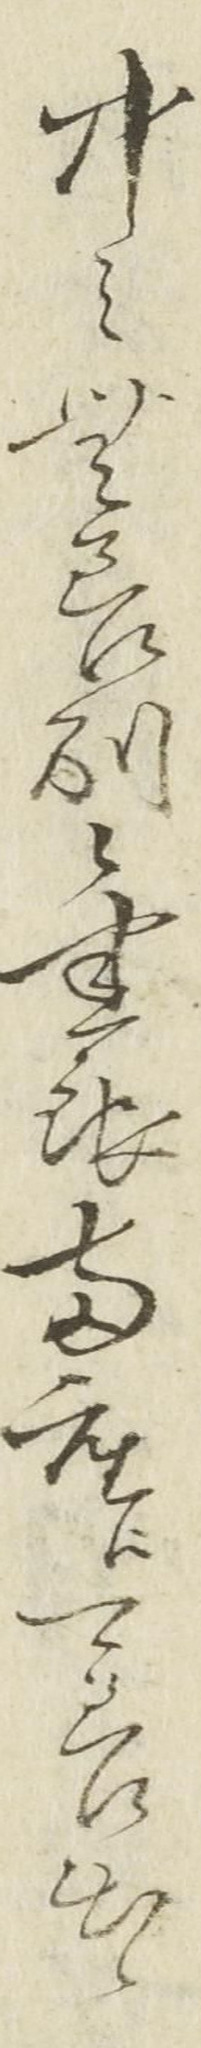中之無差別金銀両座え可差出候
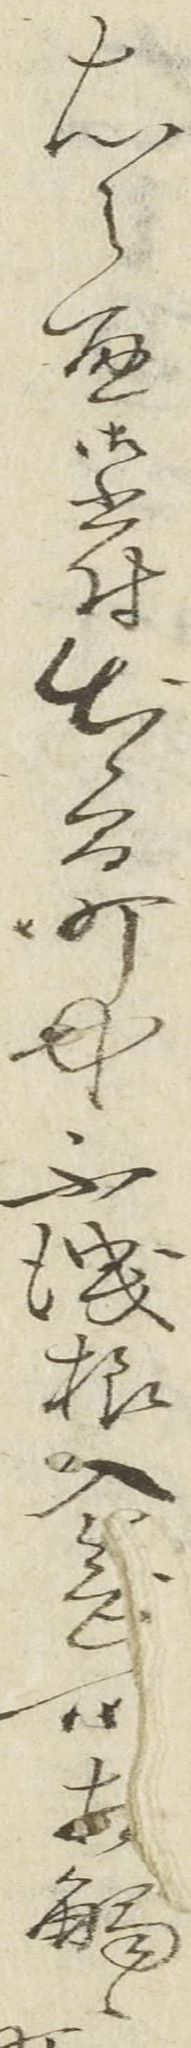右之通御書付出候間町中不洩様入念可相触候
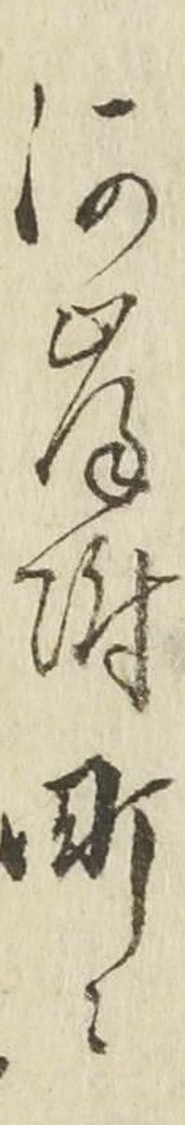河岸付町々
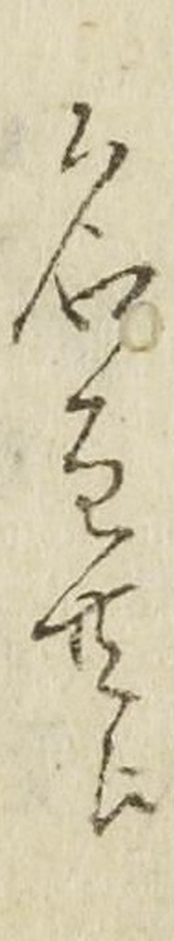名主共え
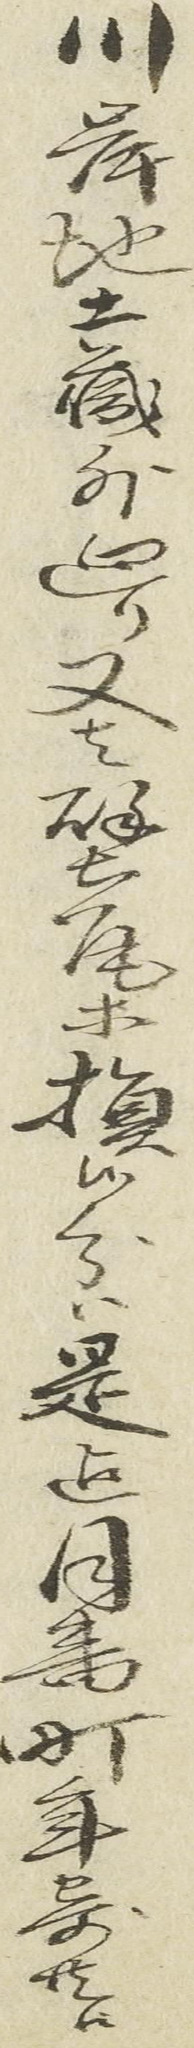川岸地土蔵外回り又は堅瓦等損候分ハ是迄月番町年寄共え
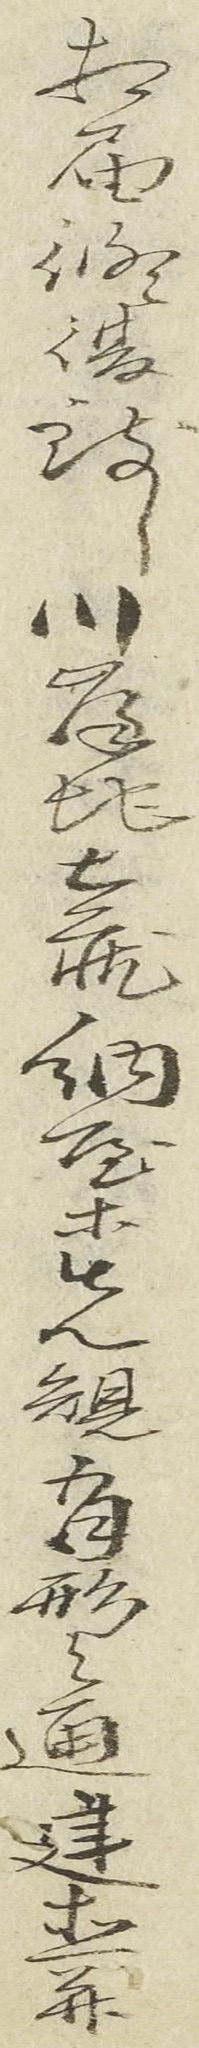相届修復致し川岸地土蔵納屋等先規有形之通建直幷
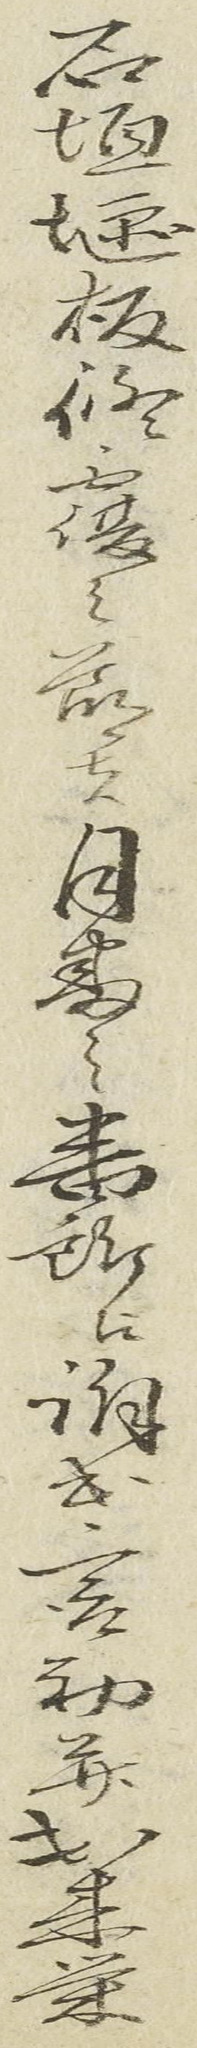石垣堰板修復之節は月番之番所え訴出最初幷出来栄
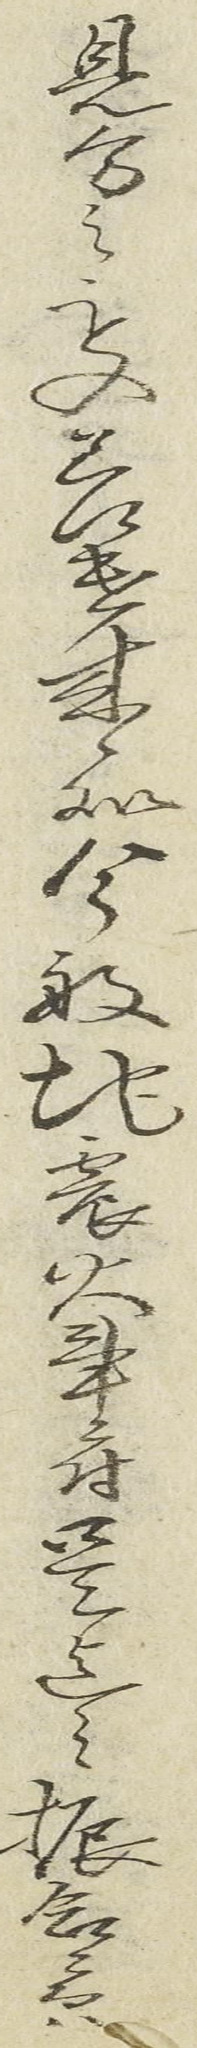見方之もの差遣来候処今般地震火事ニ付是迄之振ニ而
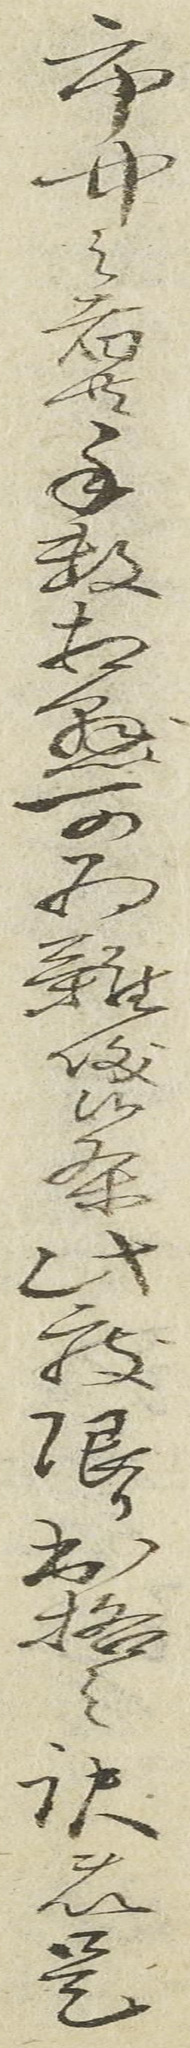市中之者共手数相懸可為難儀候条此度限り出格之訳ヲ以是
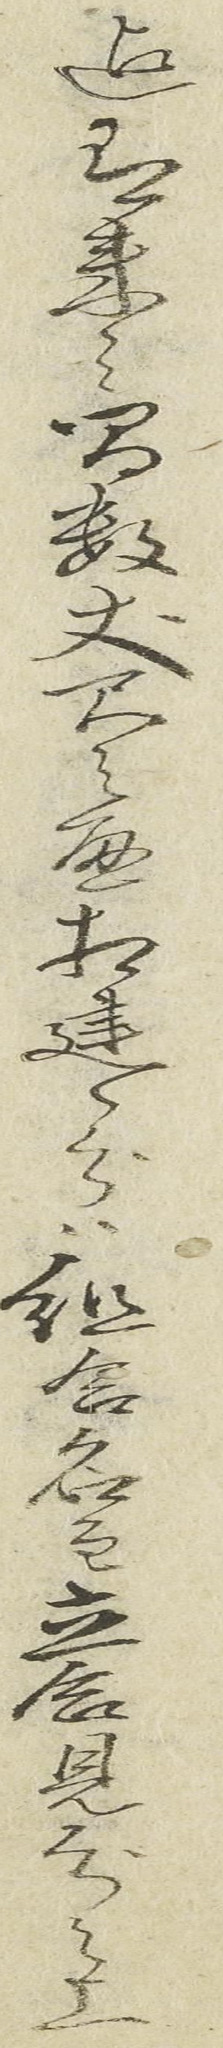迄有来之間数丈尺之通相建候分ハ組合名主立合見分之上

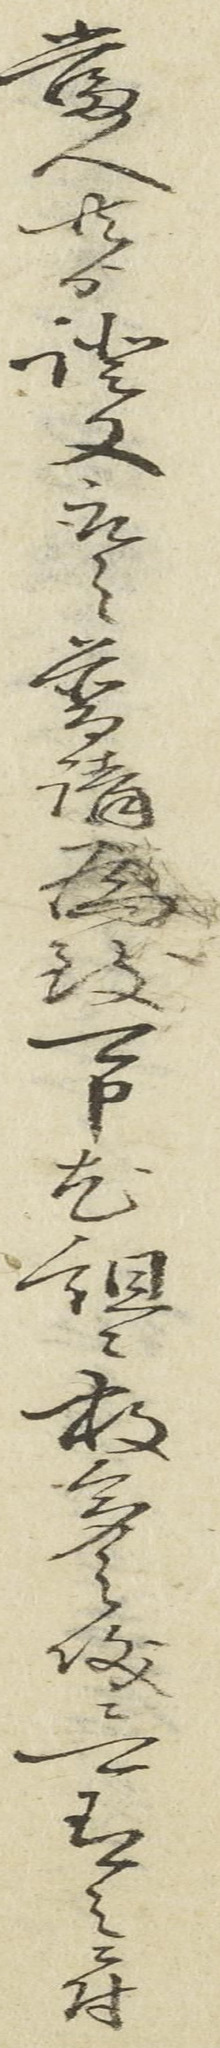当人共ゟ証文取之普請為致可申尤組々数多之儀ニ可有之ニ付
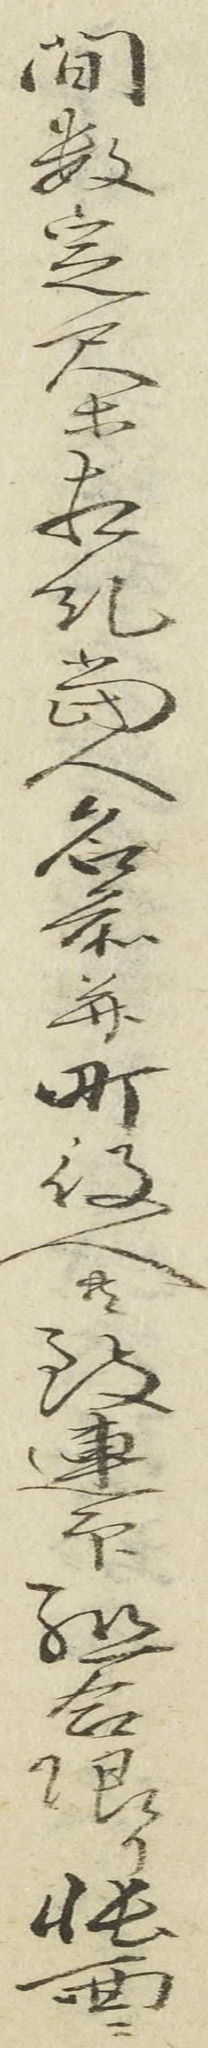間数定尺等相糺当人名前幷町役人共致連印組合限り帳面ニ
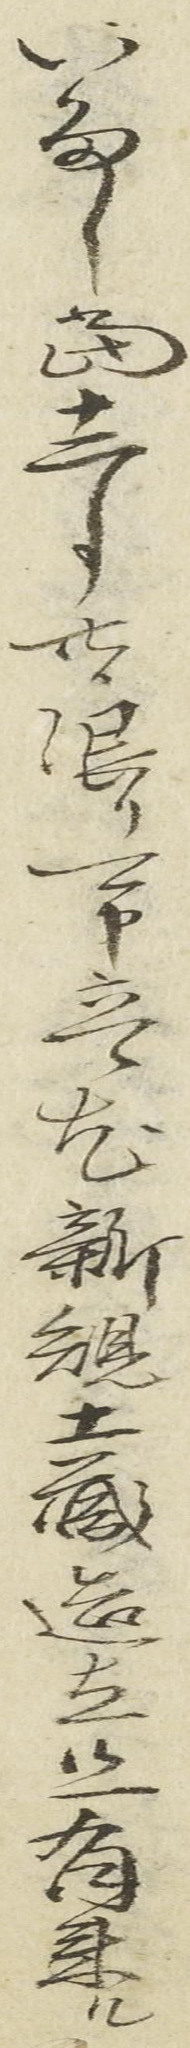いたし当十二月廿日限り可申立候尤新規土蔵造立且有来ル
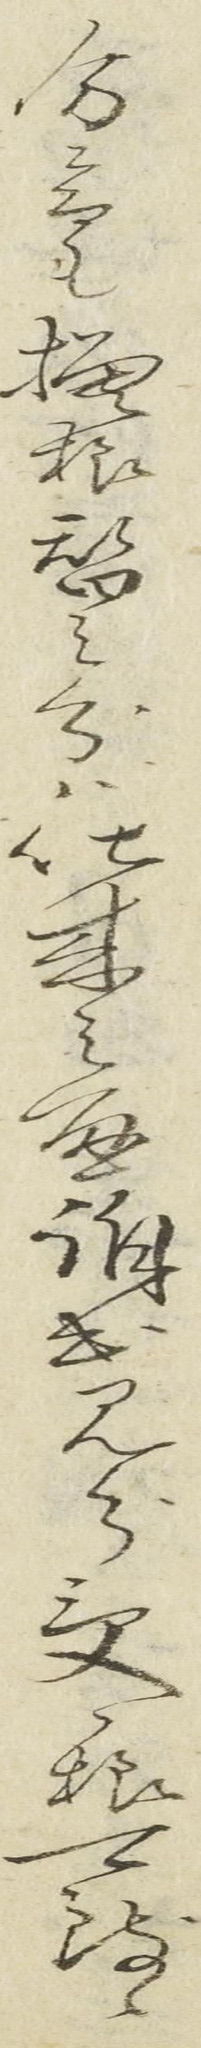方ニ而も模様替之分ハ仕来之通訴出見分受候様可致候
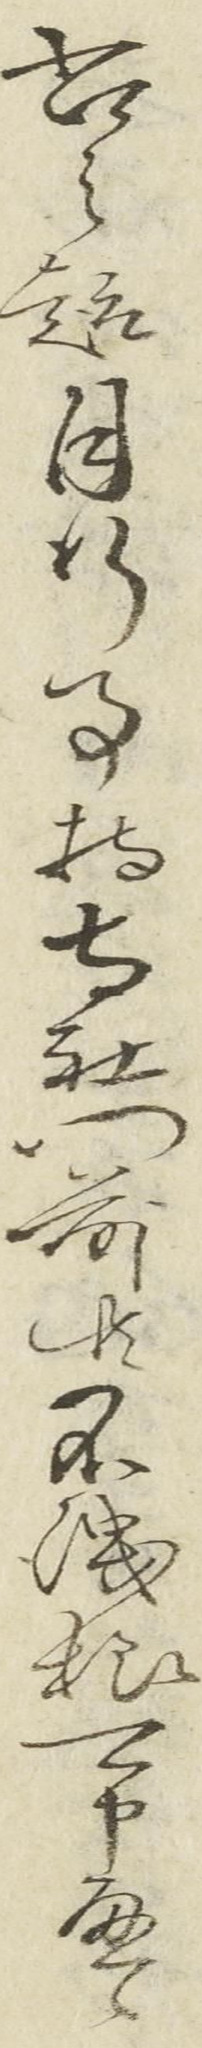右之趣月行事持寺社門前共不洩様可申通候
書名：安政二乙卯年十月二日大地震之事
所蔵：東京大学地震研究所図書室 Earthquake Research Institute Library, The University of Tokyo, JAPAN
